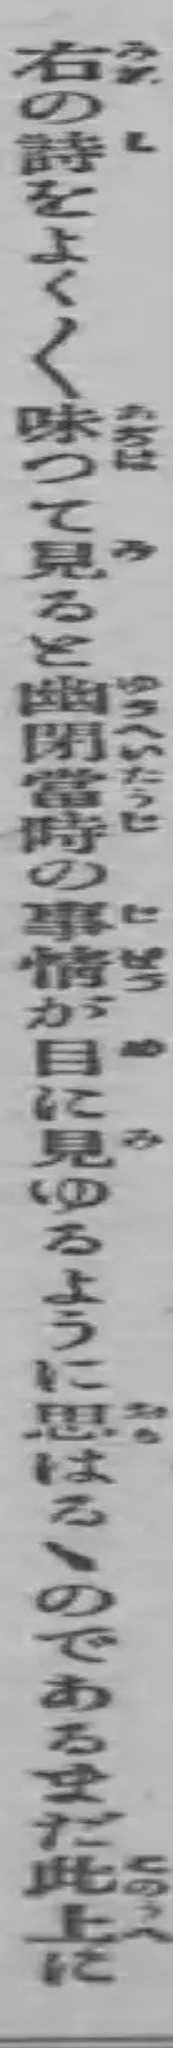右の詩をよく〳〵味つて見ると幽閉当時の事情が目に見ゆるように思はるゝのであるまた此上に
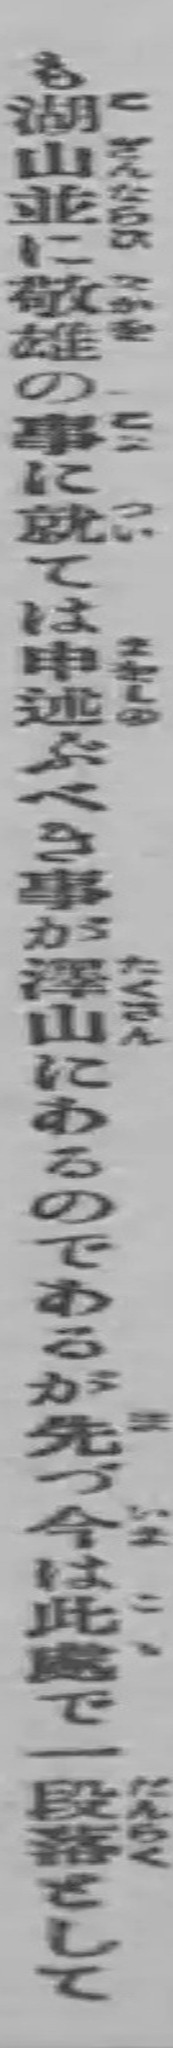も湖山並に敬雄の事に就ては申述ぶべき事が沢山にあるのであるが先づ今は此処で一段落として
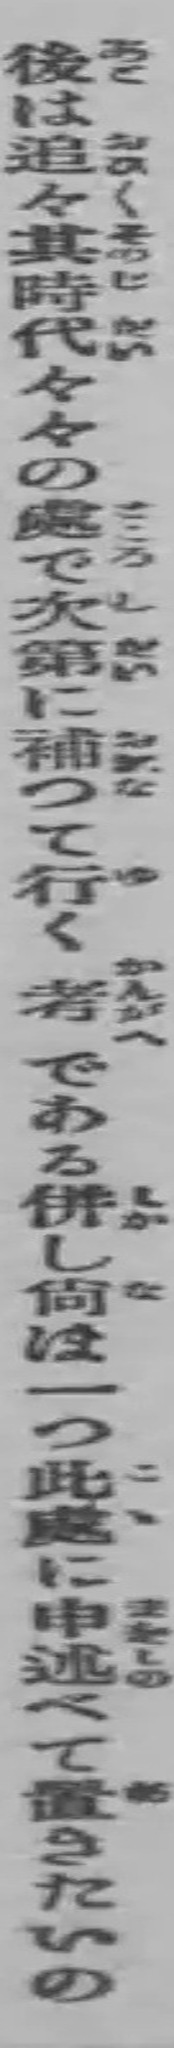後は追々其時代々々の処で次第に補つて行く考である併し尚ほ一つ此処に申述べて置きたいの
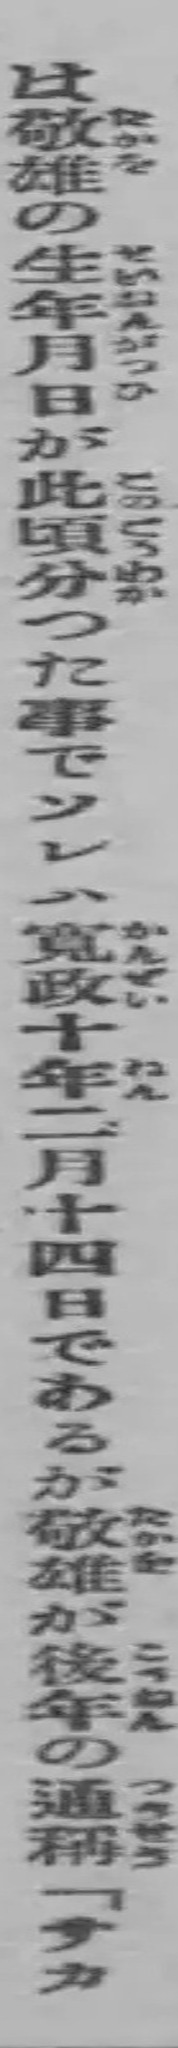は敬雄の生年月日が此頃分つた事でソレハ寛政十年二月十四日であるが敬雄が後年の通称「サカ
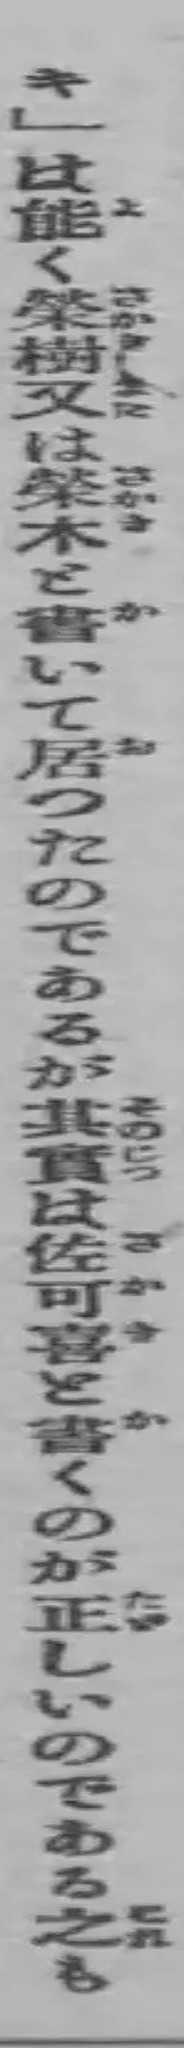キ」は能く栄樹又は栄木と書いて居つたのであるが其実は佐可喜と書くのが正しいのである之も
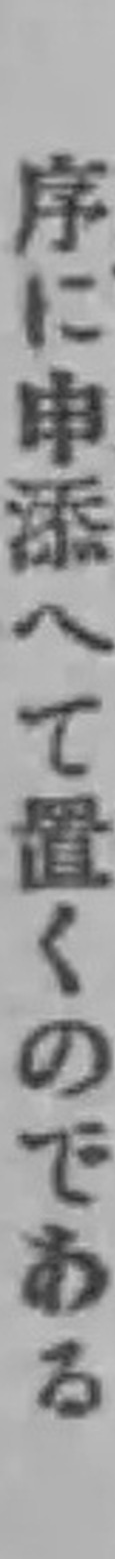序に申添へて置くのである

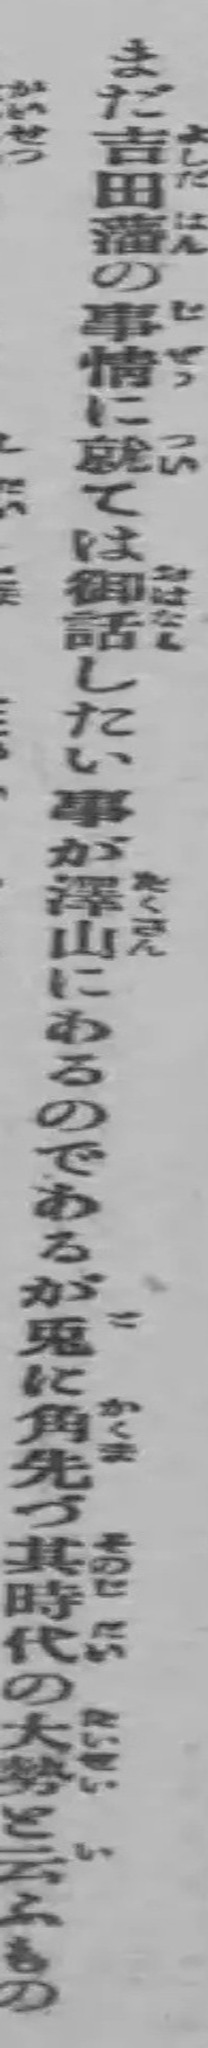まだ吉田藩の事情に就ては御話したい事が沢山にあるのであるが兎に角先づ其時代の大勢と云ふもの
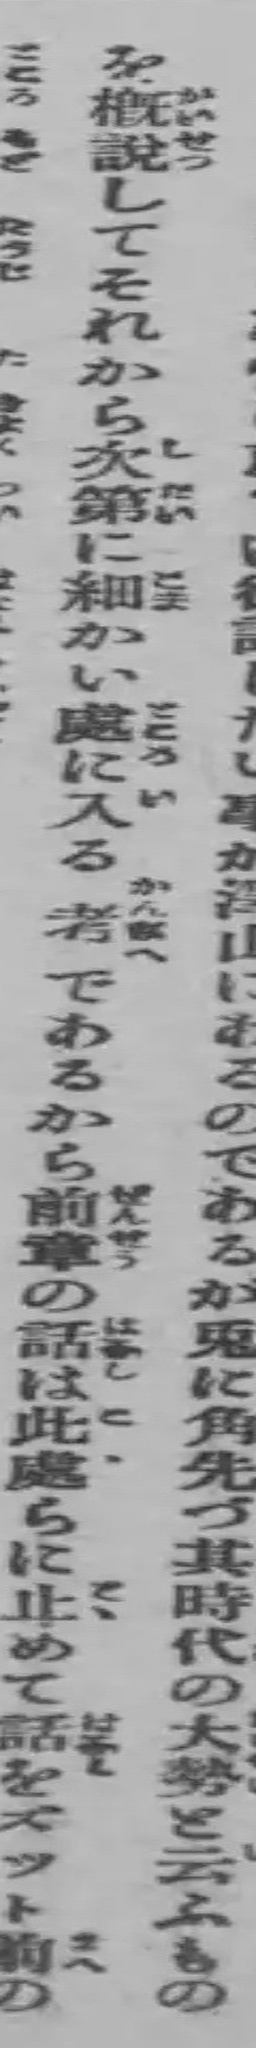を概説してそれから次第に細かい処に入る考であるから前章の話は此処らに止めて話をズツト前の
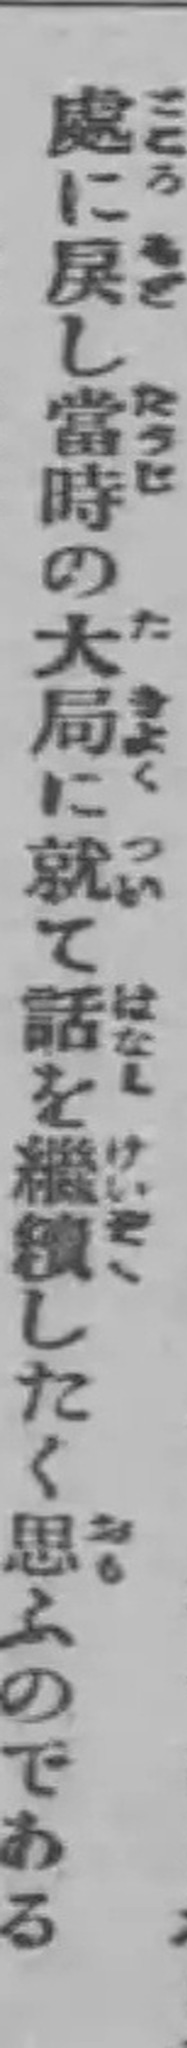処に戻し当時の大局に就て話を継続したく思ふのである
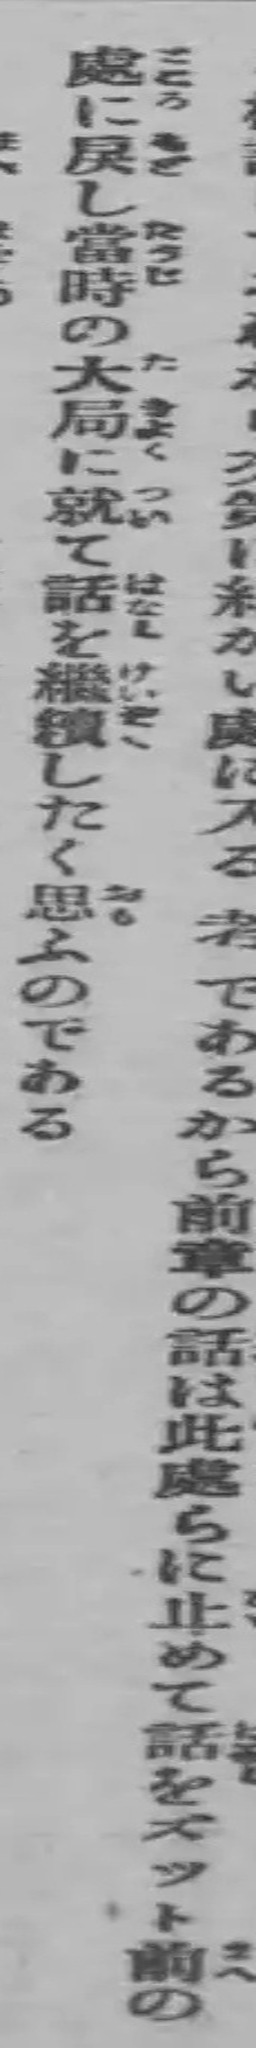処に戻し当時の大局に就て話を継続したく思ふのである
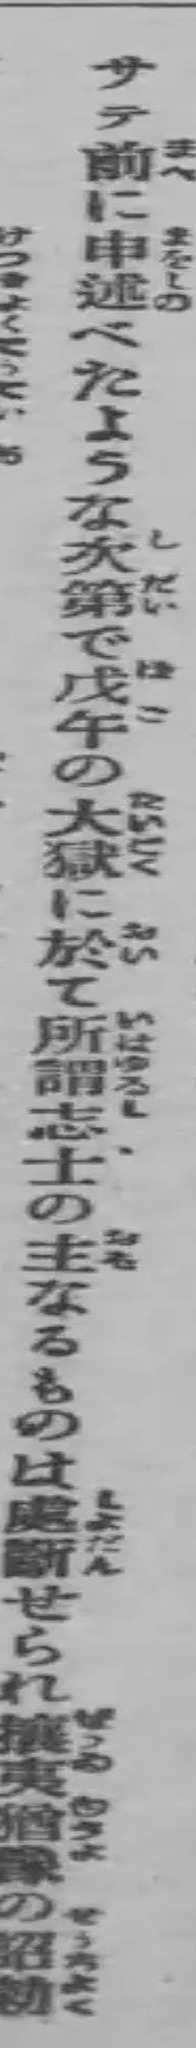サテ前に申述べたような次第で戊午の大獄に於て所謂志士の主なるものは処断せられ攘夷猶予の詔勅
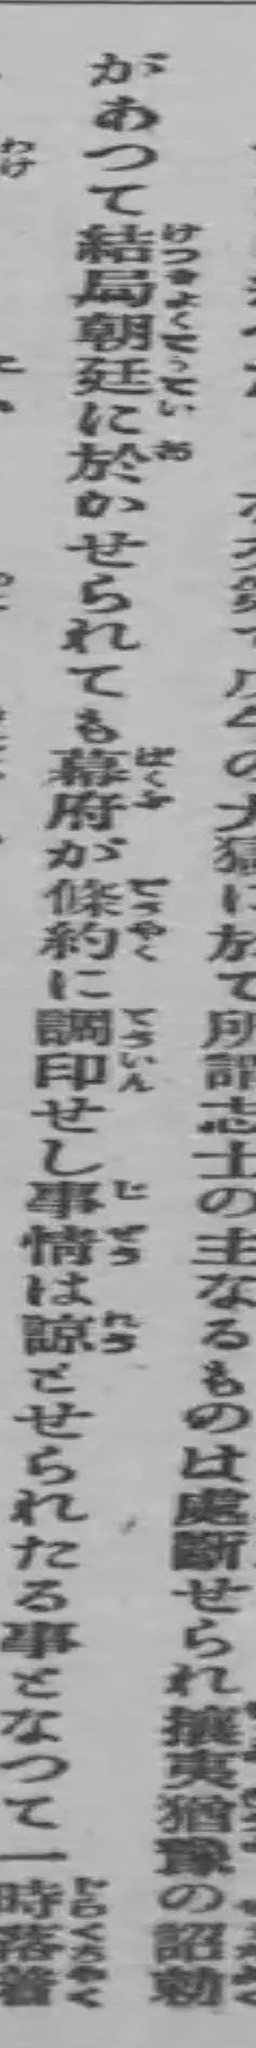があつて結局朝廷に於かせられても幕府が条約に調印せし事情は諒とせられたる事となつて一時落着
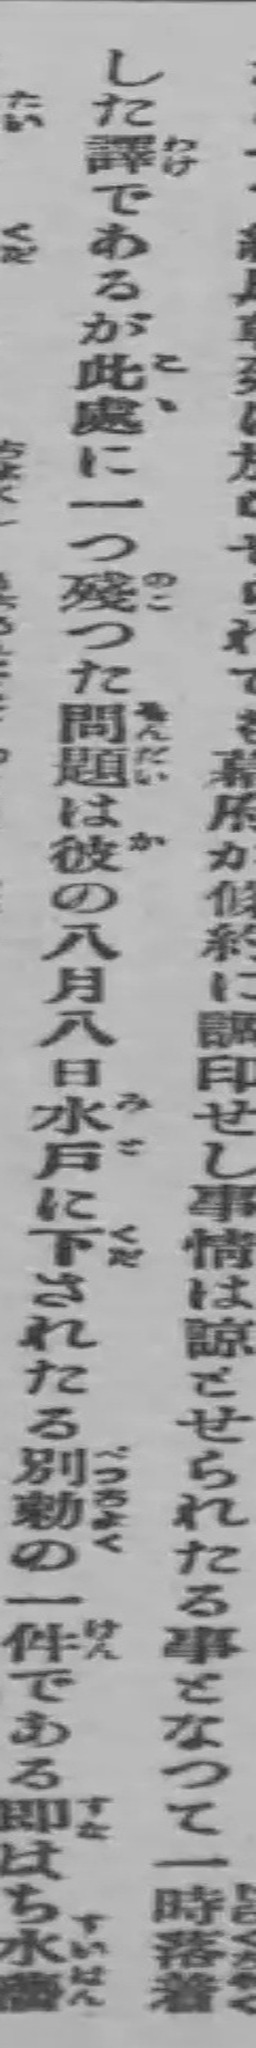した訳であるが此処に一つ残つた問題は彼の八月八日水戸に下されたる別勅の一件である即はち水藩
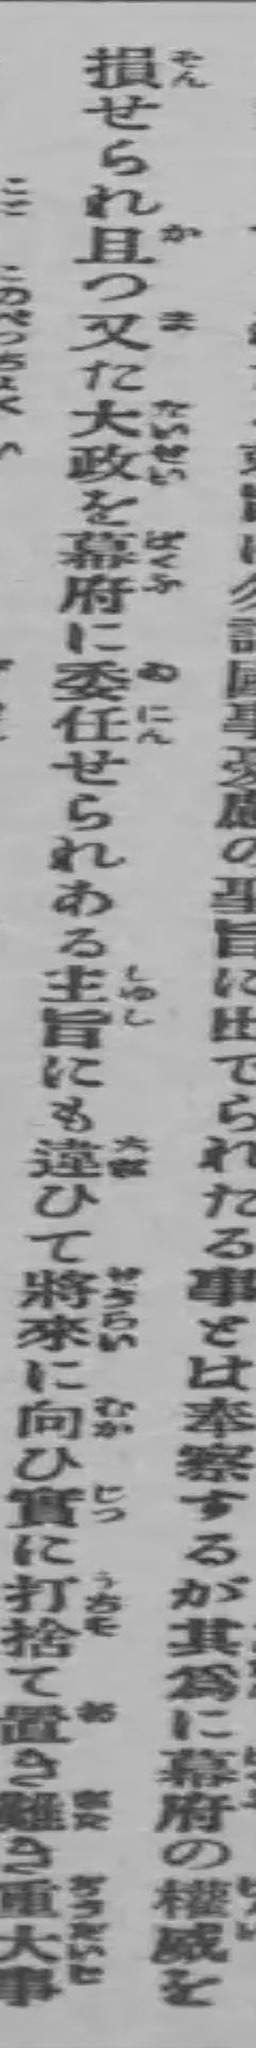損せられ且つ又た大政を幕府に委任せられある主旨にも違ひて将来に向ひ実に打捨て置き難き重大事
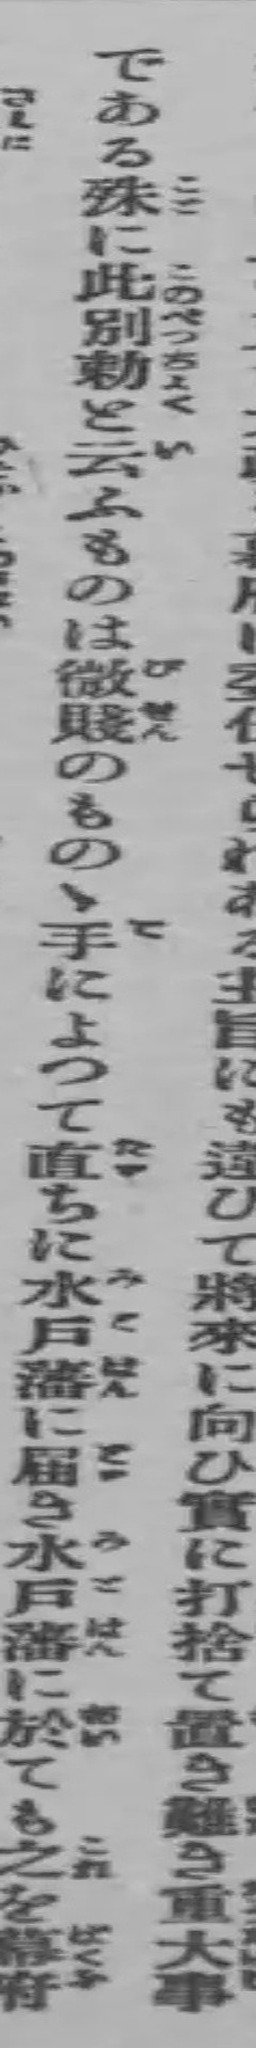である殊に此別勅と云ふものは微賤のものゝ手によつて直ちに水戸藩に届き水戸藩に於ても之を幕府
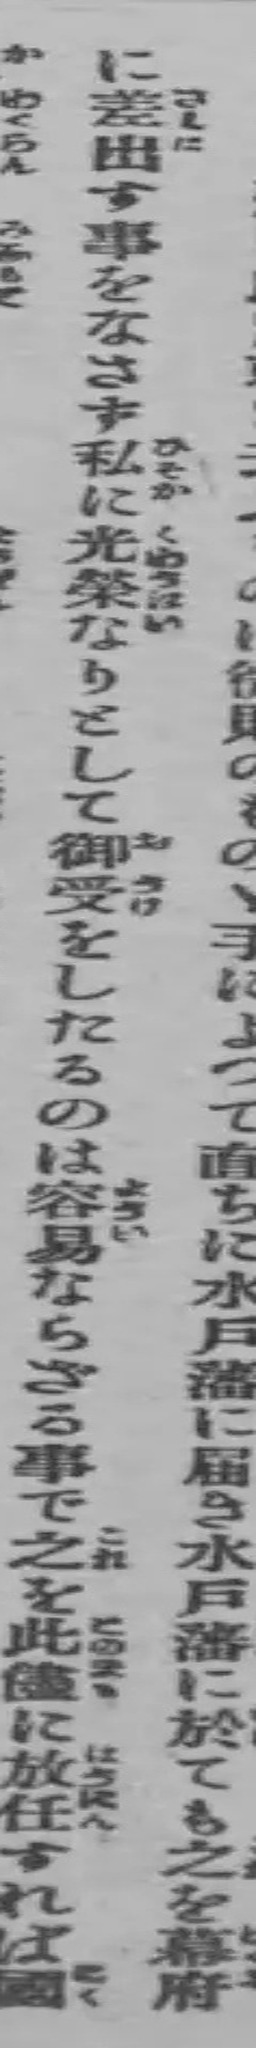に差出す事をなさず私に光栄なりとして御受をしたるのは容易ならざる事で之を此侭に放任すれば国
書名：豊橋市史談
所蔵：国立国会図書館 National Diet Library, JAPAN
